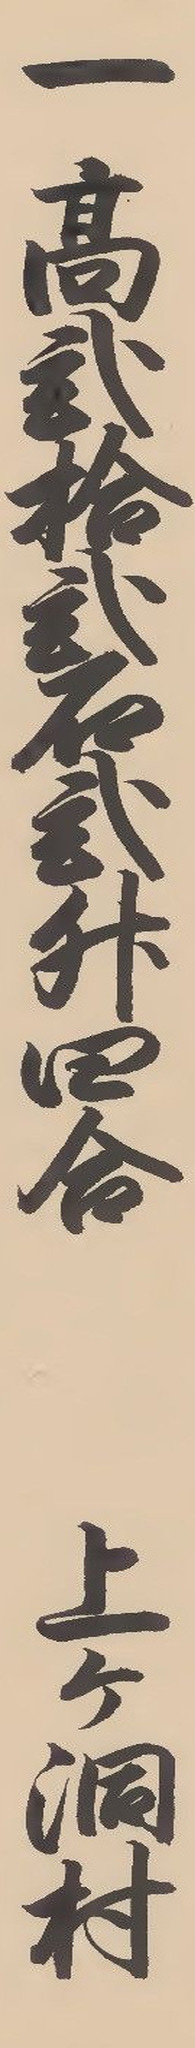一高弐拾弐石弐升四合上ヶ洞村
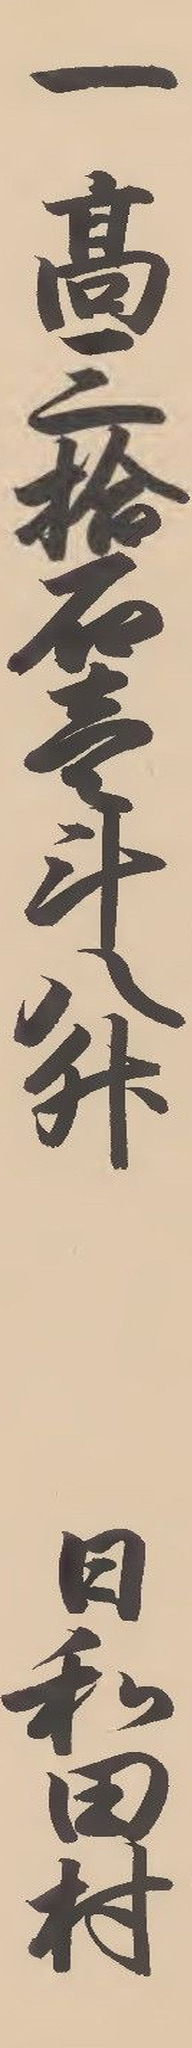一高三拾石壱斗八升日和田村
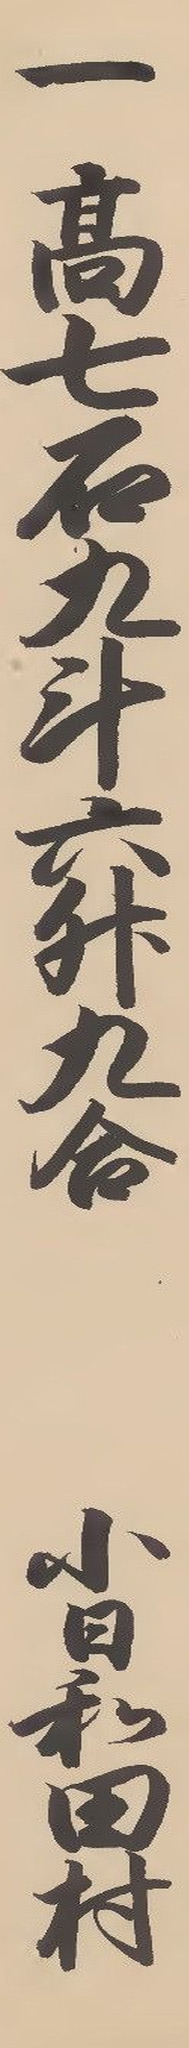一高七石九斗六升九合小日和田村
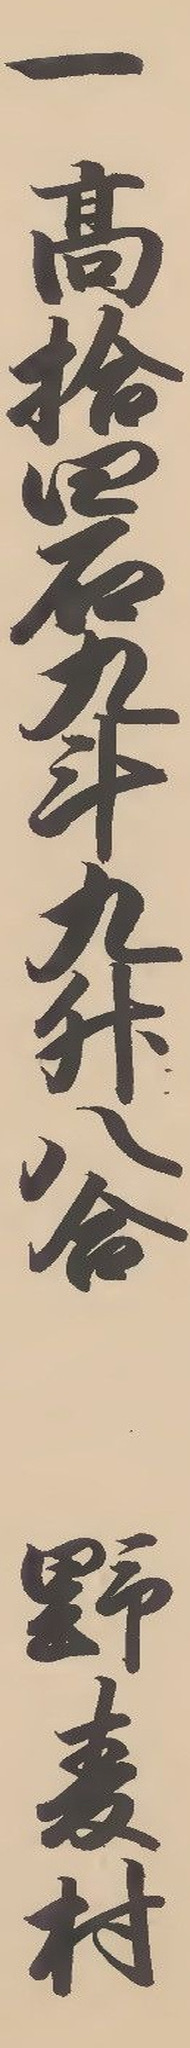一高拾四石九斗九升八合野麦村
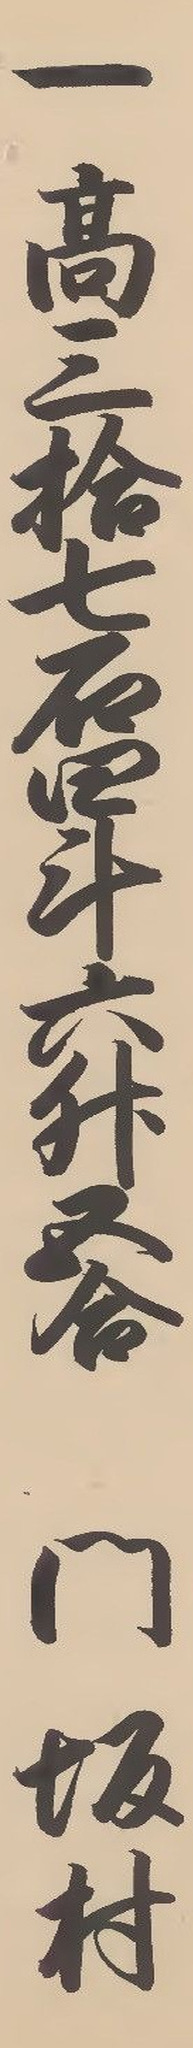一高三拾七石四斗六升五合門坂村
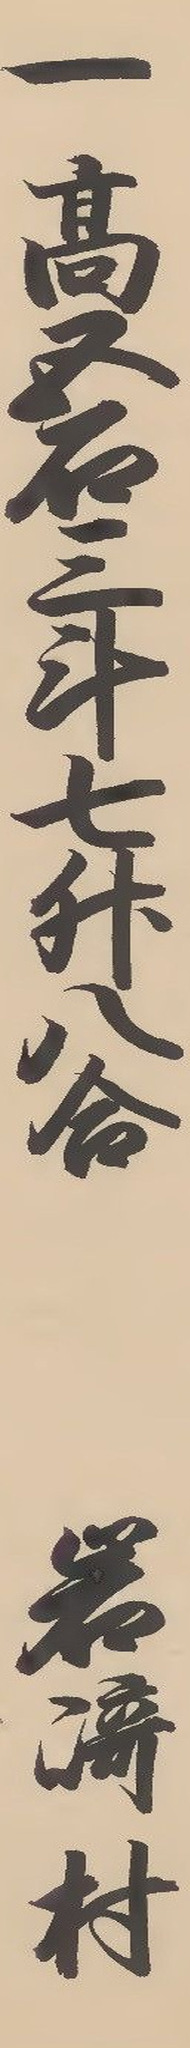一高五石三斗七升八合岩崎村

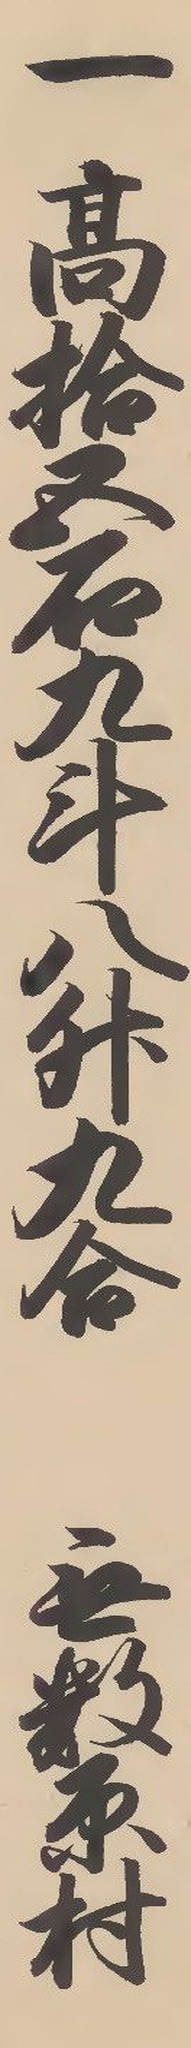一高拾五石九斗八升九合無数原村
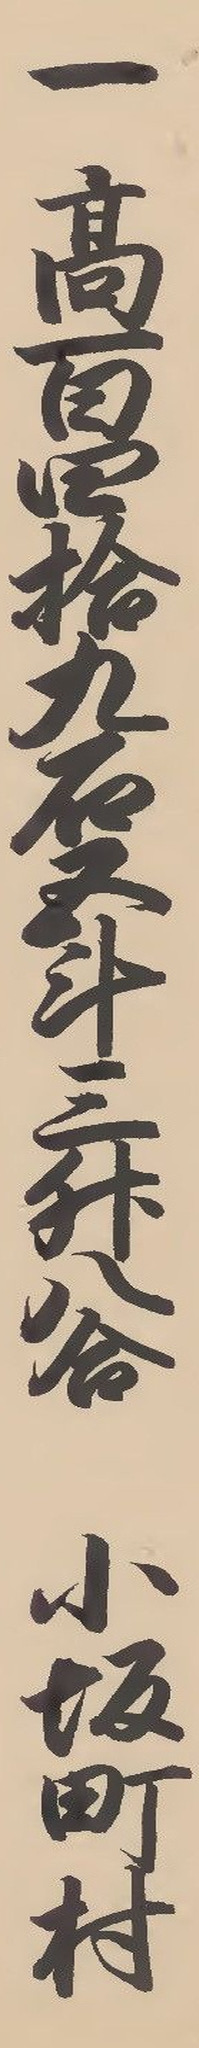一高百四拾九石五斗三升八合小坂町村
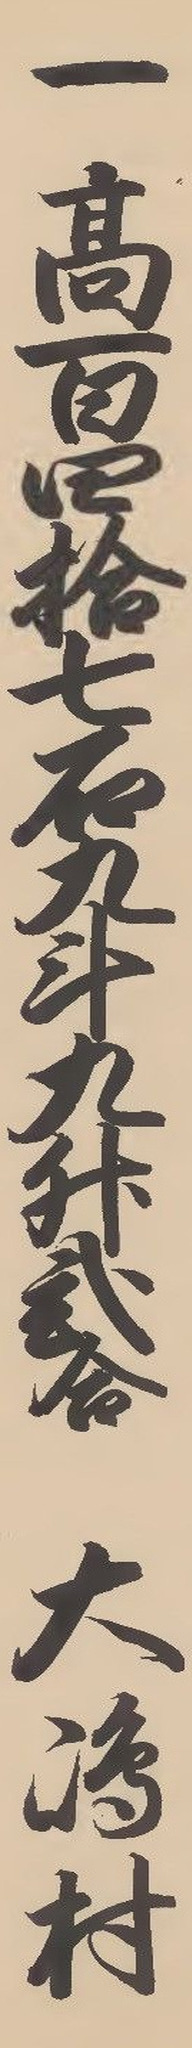一高百四拾七石九斗九升弐合大島村
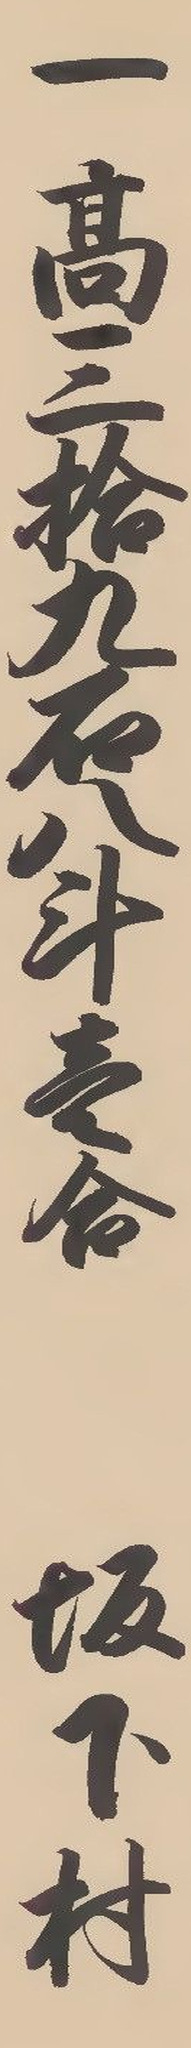一高三拾九石八斗壱合坂下村
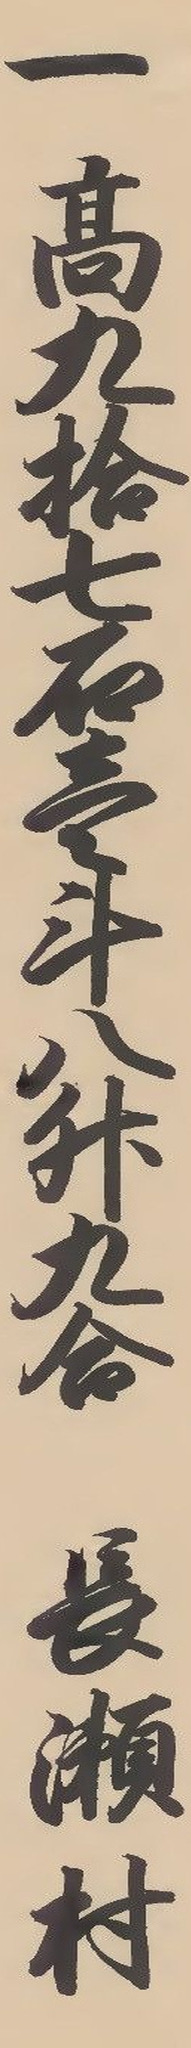一高九拾七石壱斗八升九合長瀬村
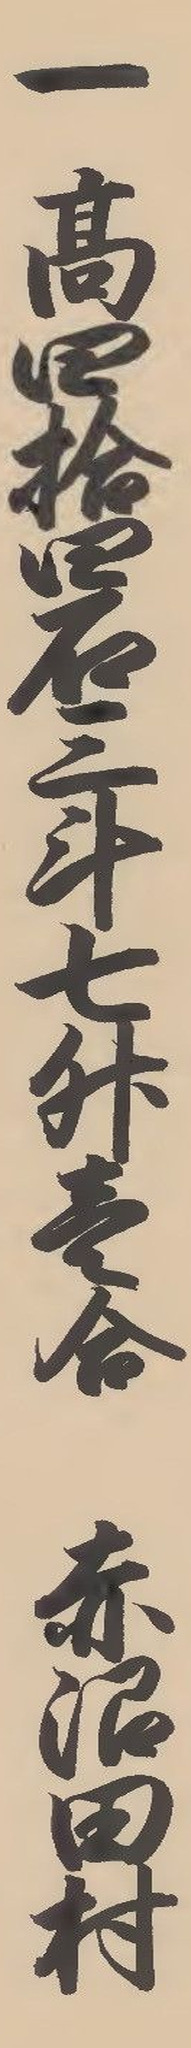一高四拾四石三斗七升壱合赤沼田村
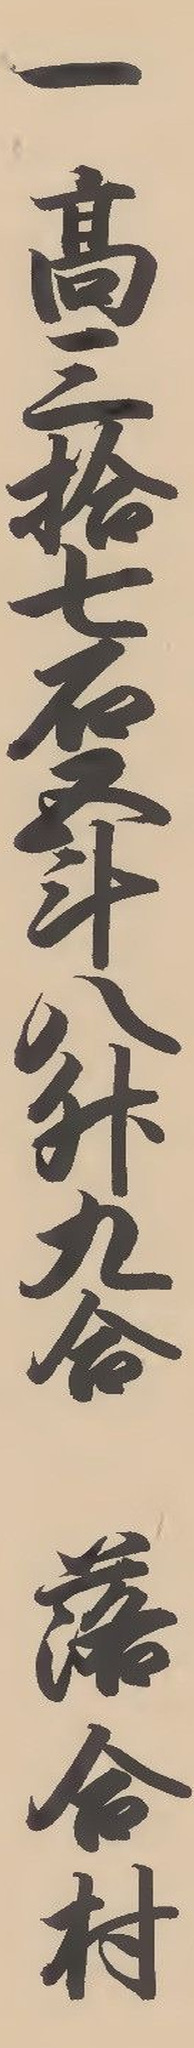一高三拾七石五斗八升九合落合村
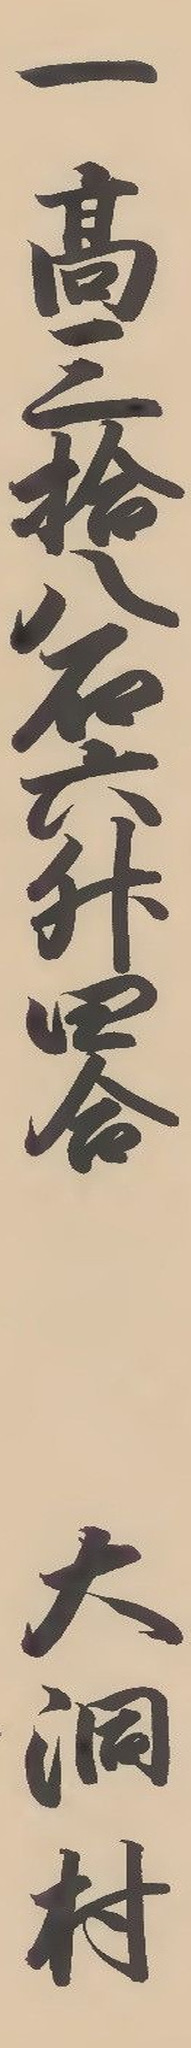一高三拾八石六升四合大洞村

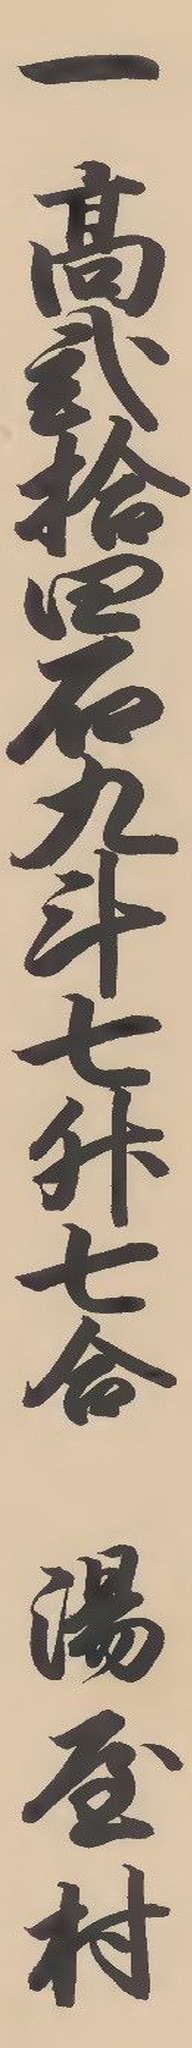一高弐拾四石九斗七升七合湯屋村
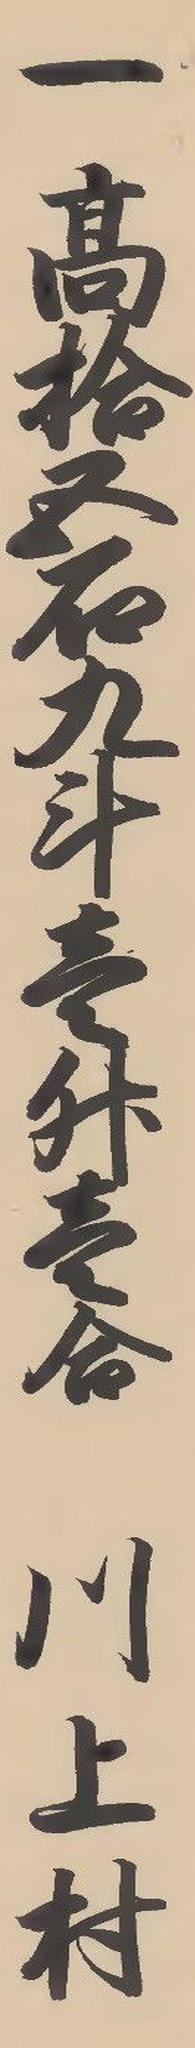一高拾五石九斗壱升壱合川上村
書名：飛騨国郷帳
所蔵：国立公文書館 National Archives of Japan
